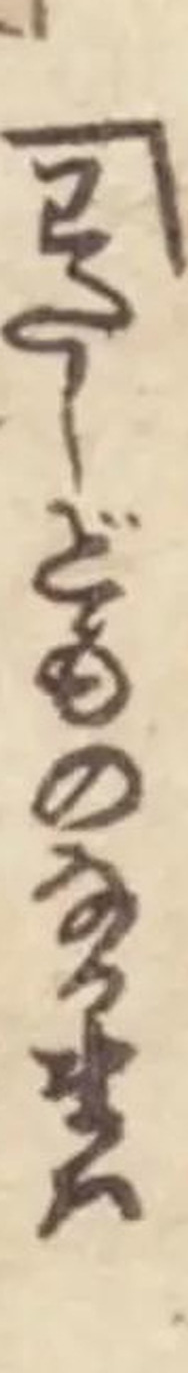「わたしどものなかまは
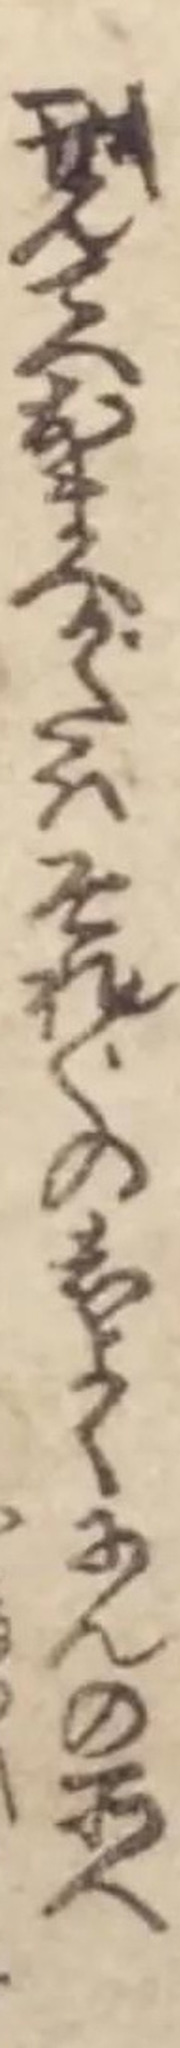「ぜんてへおまへがたはそれ〴〵のしよくにんの所へ
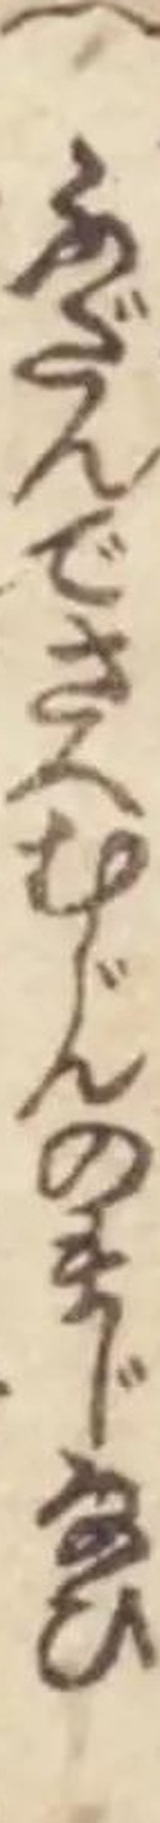ふだんでさへむじんのまじなひ
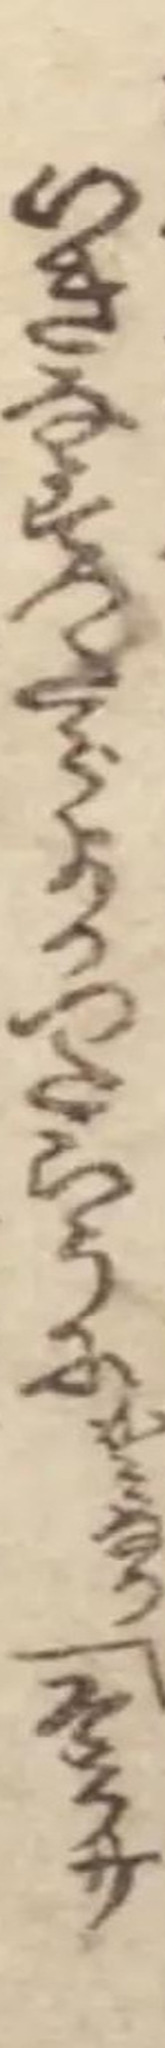いきなすつたらよかつたろうにかみなり「そうサ
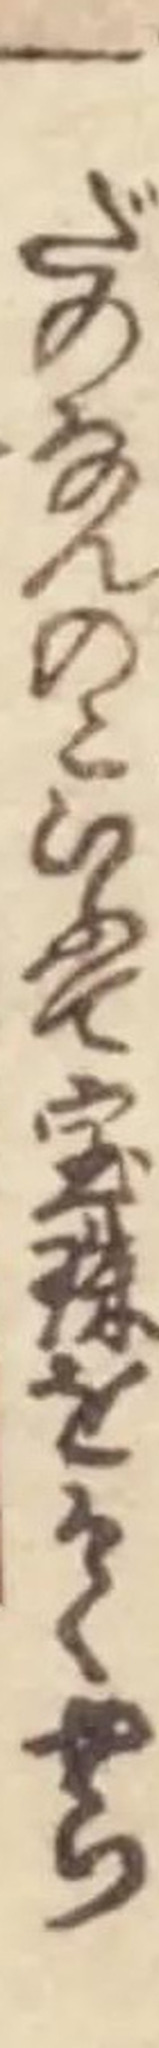だのなんのといふて宝珠をそくやら
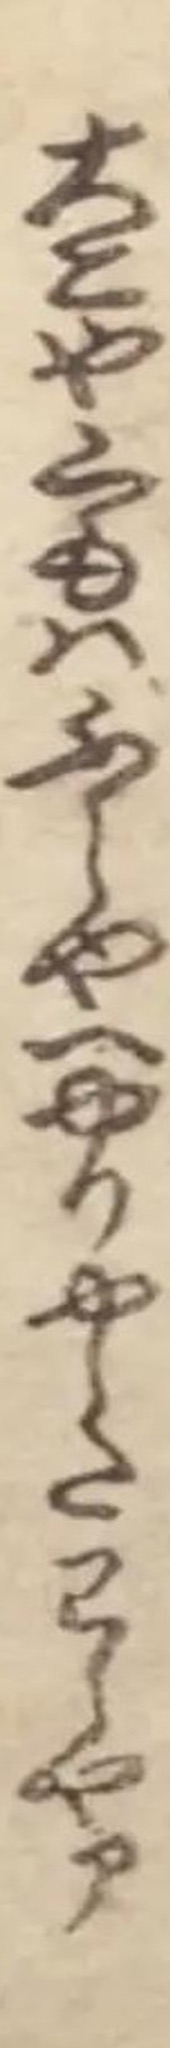大こやくもはふしやへやりやしたわしやア
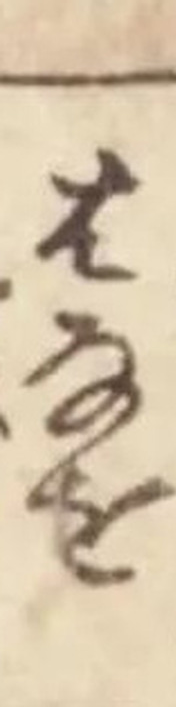はなを
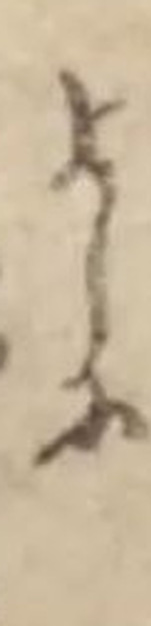よしに
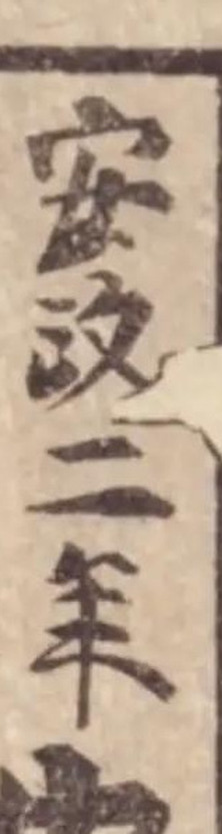安政二年
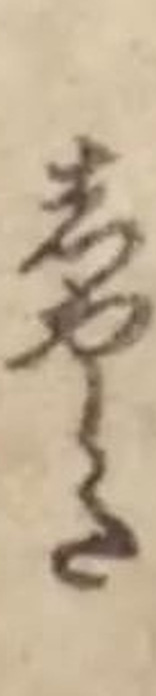しやした
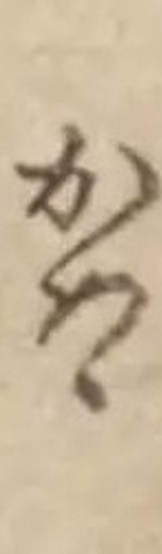かはゝ
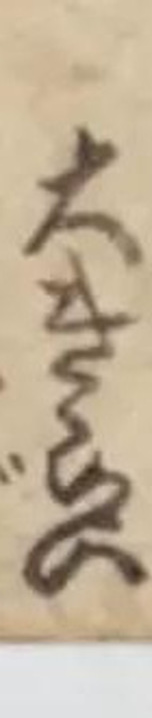大きらい
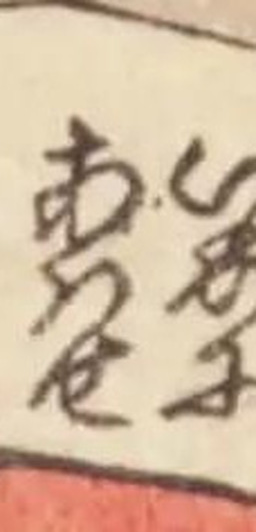あはせ
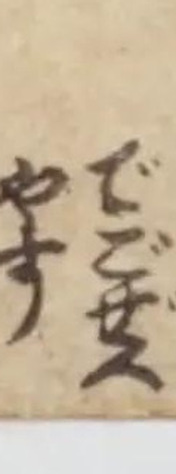でごぜへ
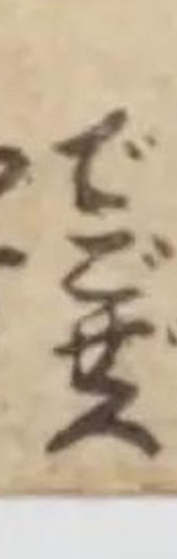でごぜへ
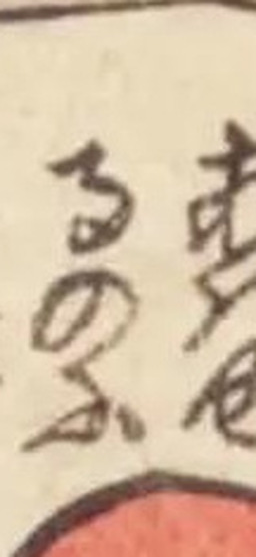るのに
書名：安政二年十月二日地震出火後日角力
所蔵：国立国会図書館 National Diet Library, JAPAN
